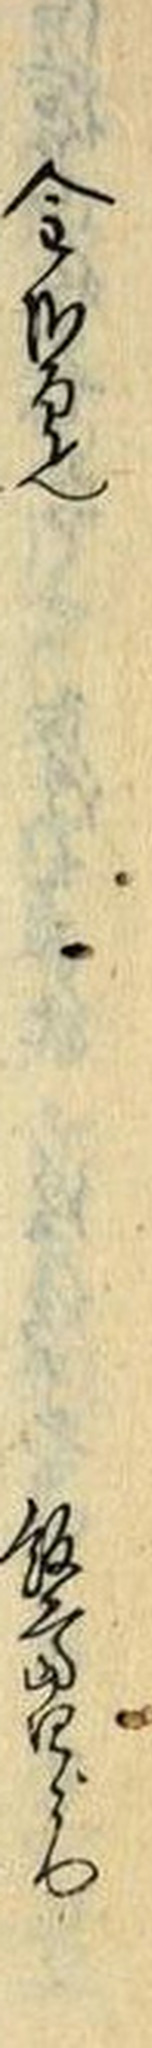金弐百疋飯嶋四郎右衛門
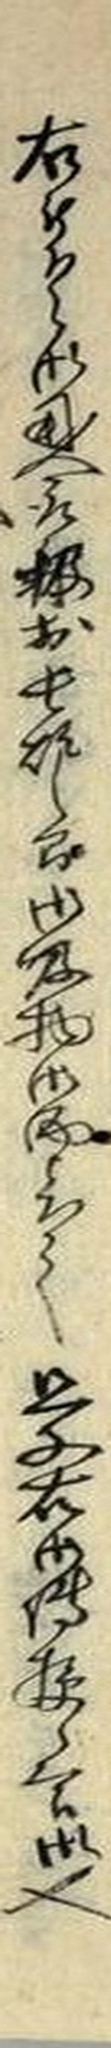右被下之御用人取扱於長炉之間御吸物御酒被下之且又右御伝授候節御人
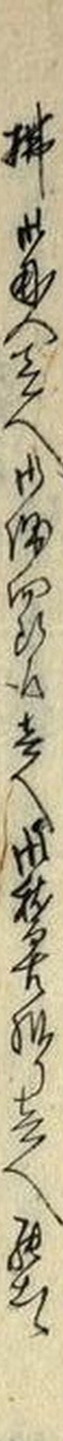払御用人壱人御側向頭取壱人御稽古掛り壱人罷出候
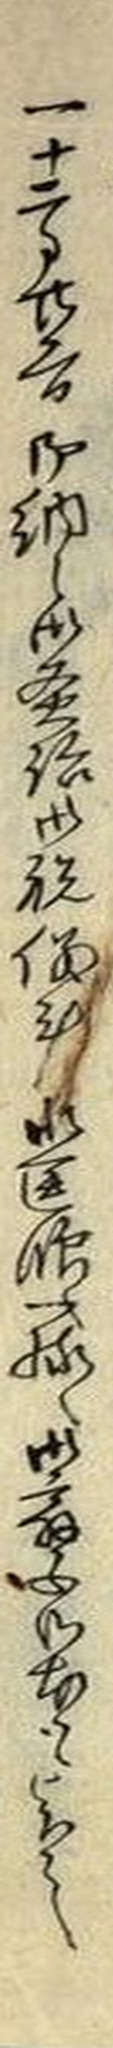一十二月廿二日御納之御灸治御祝儀斗御医師方一統へ御扇子弐本ツゝ被下之
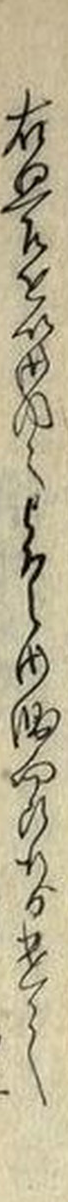右思召を以御内々被下之御側向頭取ゟ被遣之
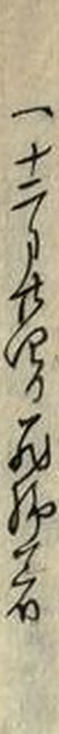一十二月廿四日飛脚着
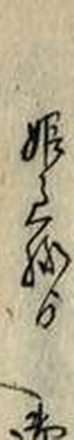姫君様ゟ
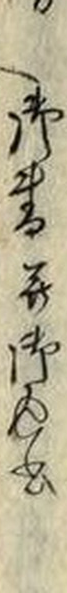御書并御返書
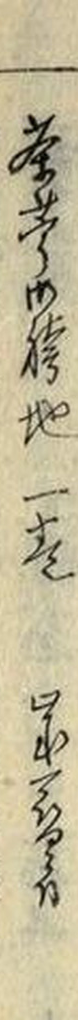茶苧御袴地一巻歳暮ニ付
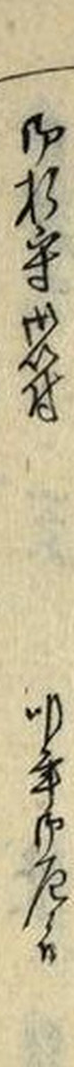御札守御符明年御厄ニ付
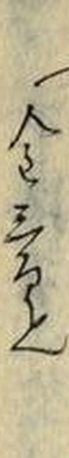金三百疋

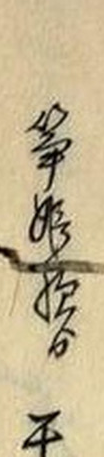箏姫様ゟ
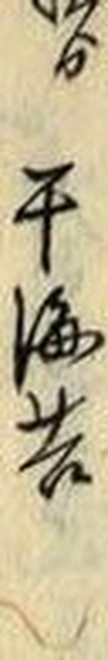干海苔
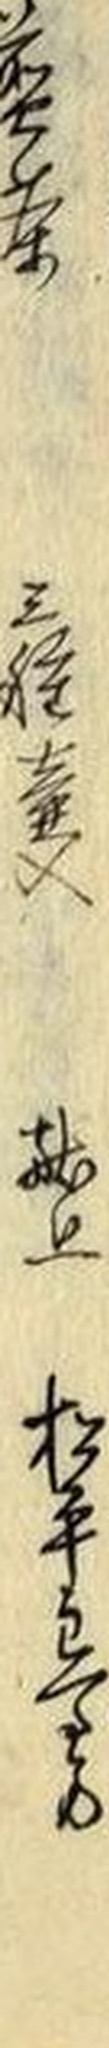煎茶三種壺入献上松平主馬方
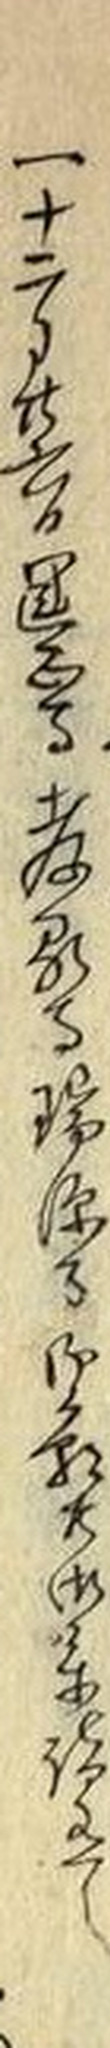一十二月廿六日運正寺孝顕寺瑞源寺御廟共御参詣有之
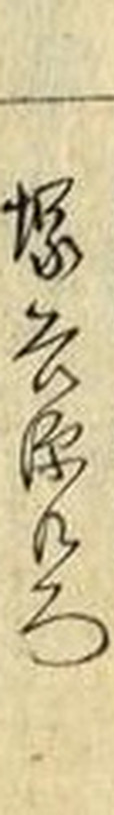塚谷源左衛門
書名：少傅日録抄（斉承付側向頭取日記、在国）
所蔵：福井県文書館 Fukui Prefectural Archives
